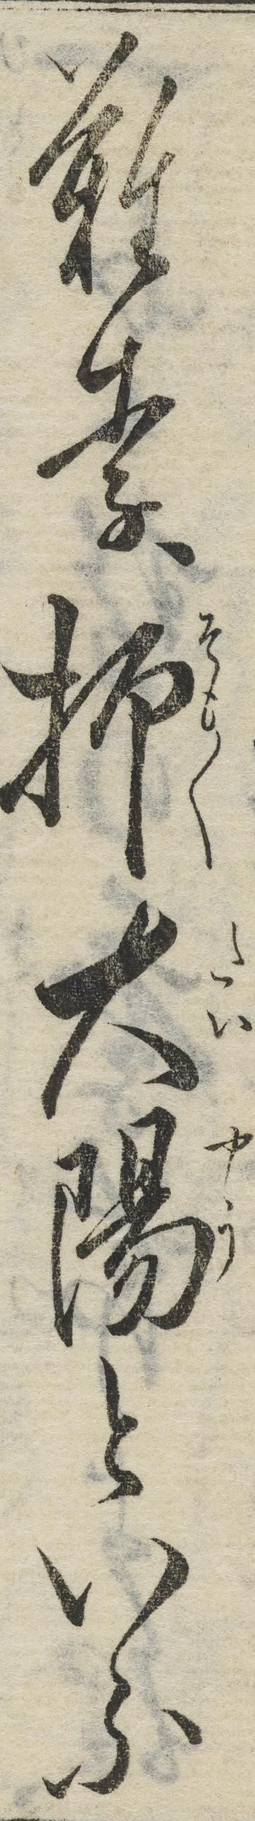なり、抑太陽といふ
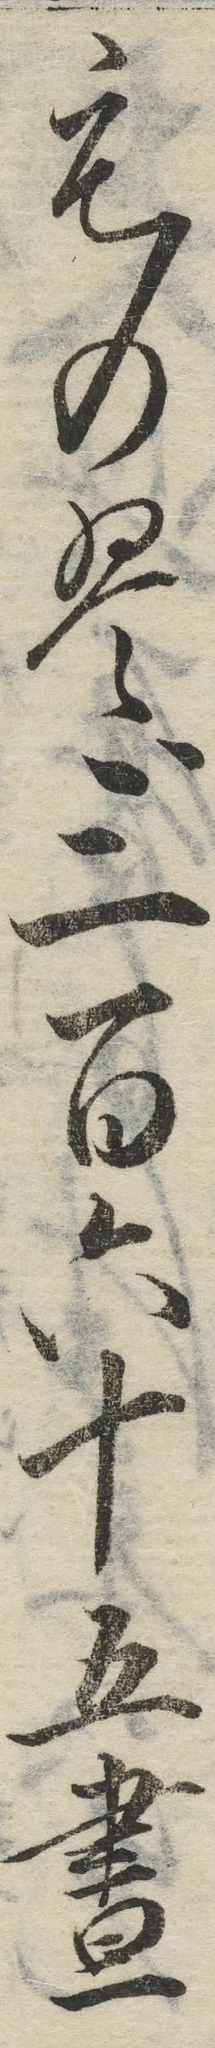ものは、三百六十五昼
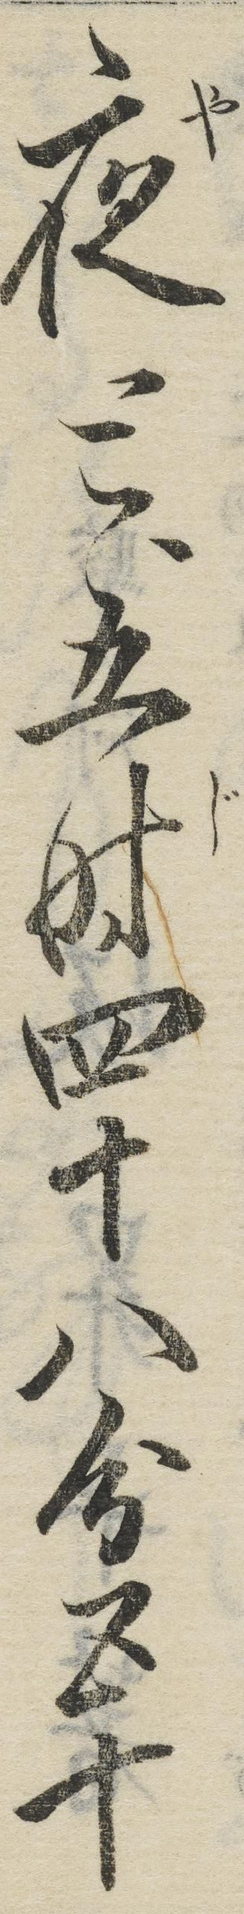夜と、五時四十八分五十
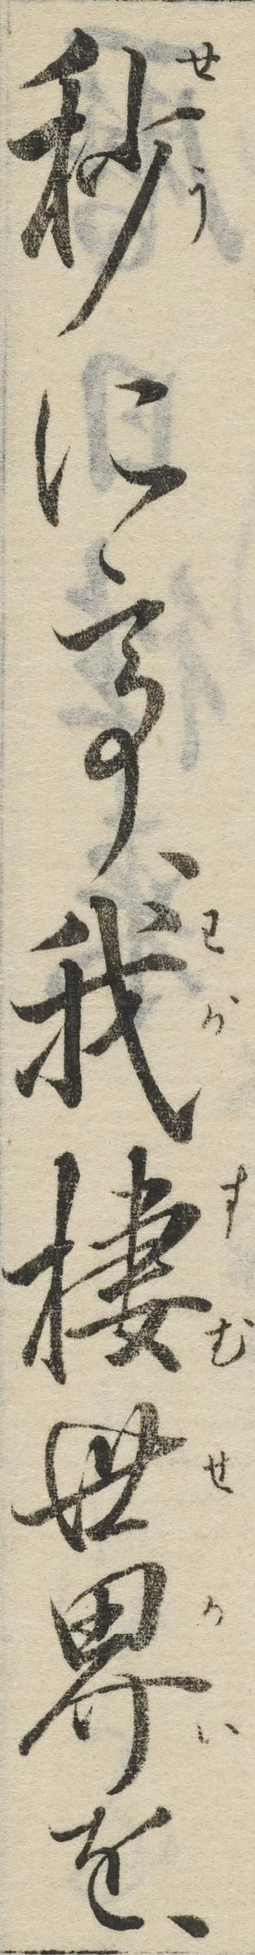秒にて、我棲世界を、
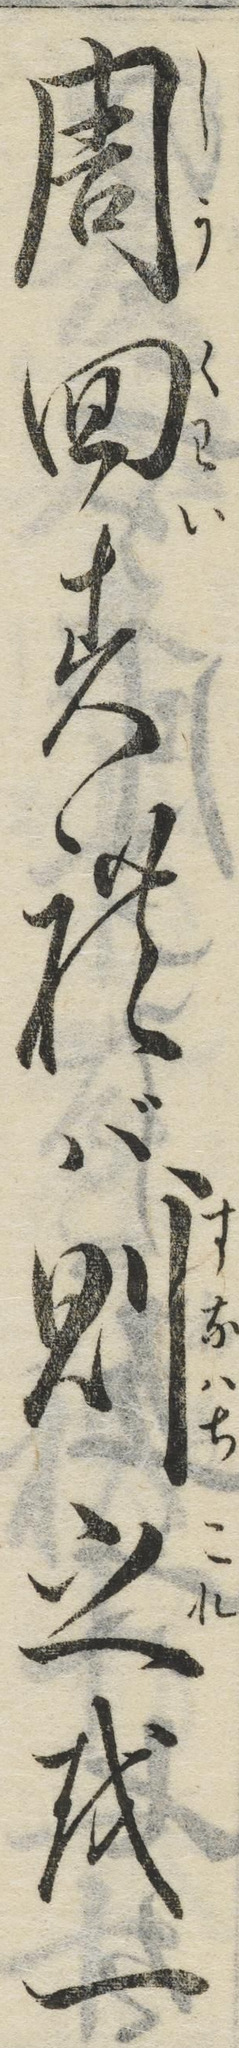周回すれば、則之を一
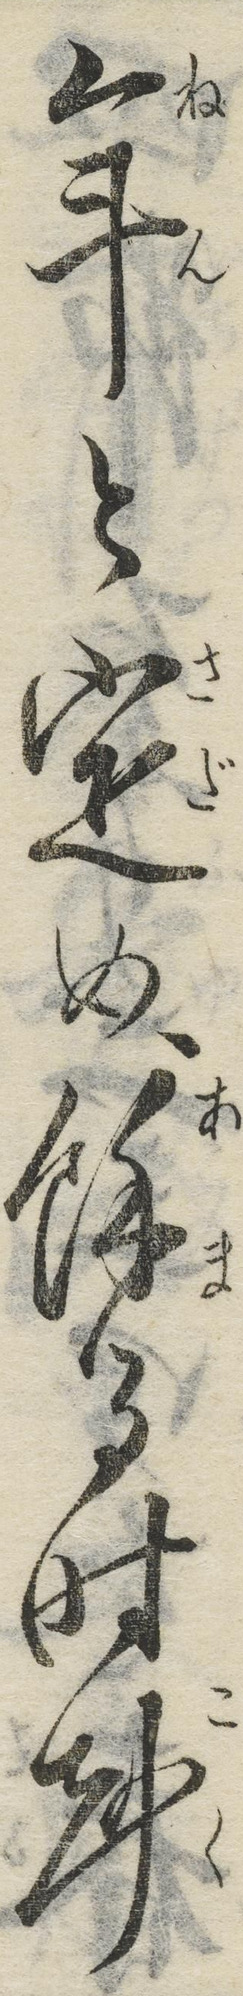年と定め、餘る時刻
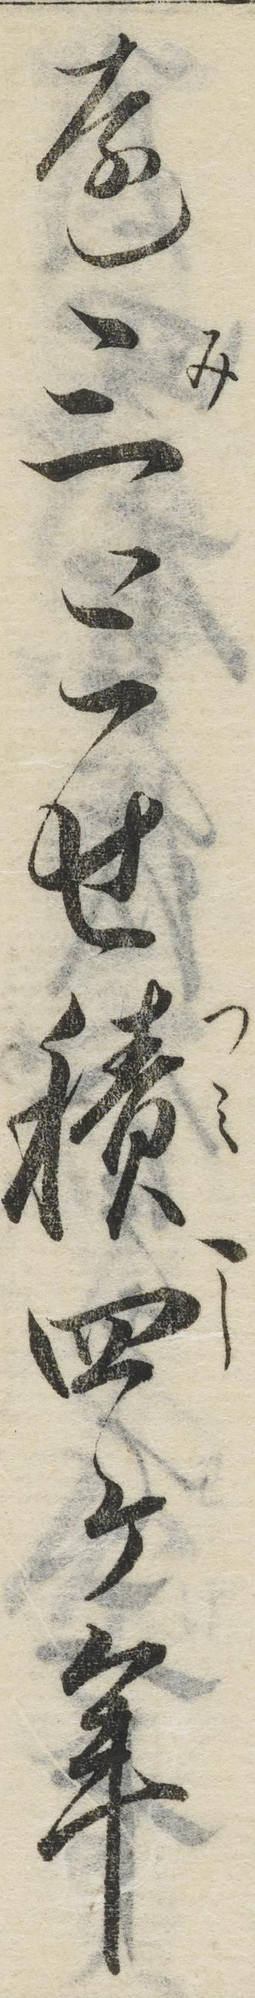を三とせ積、四ヶ年
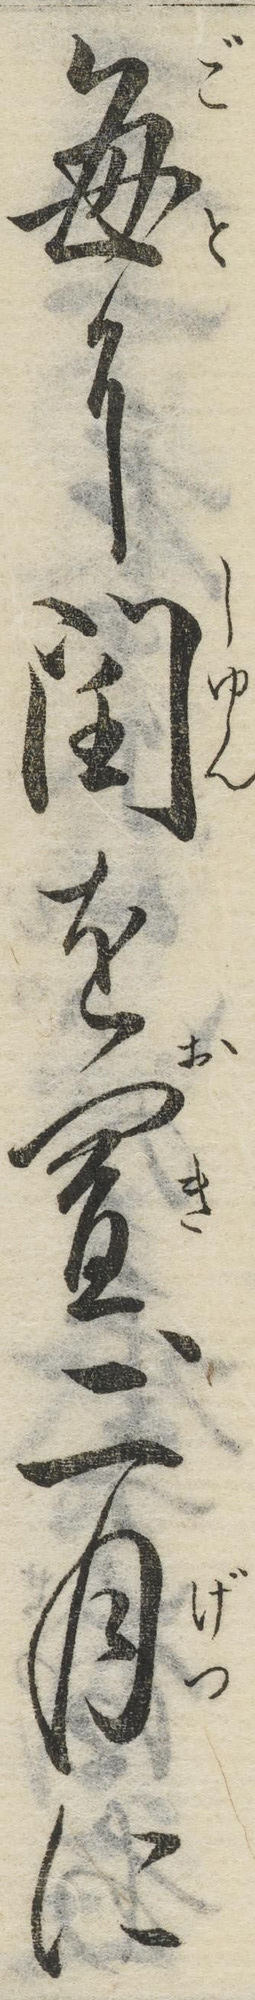毎に閏を置、二月に
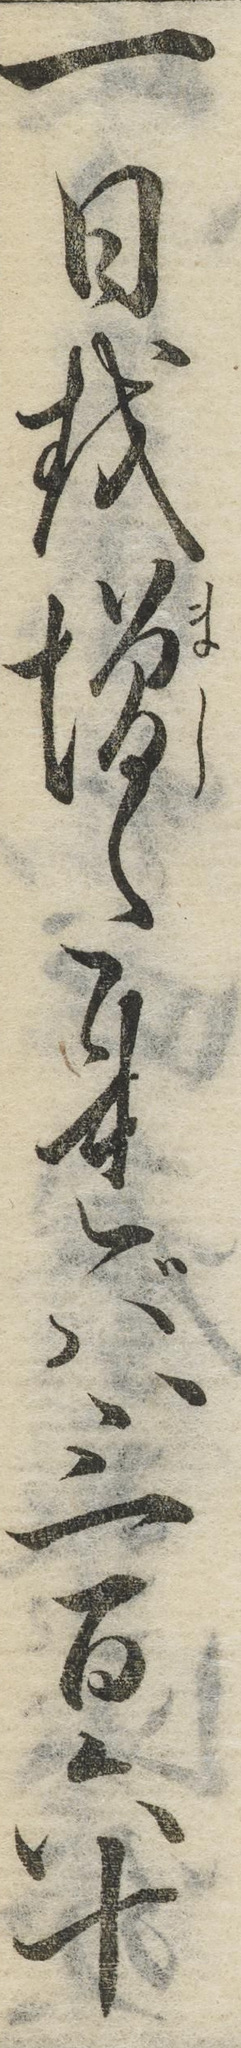一日を増たれば、三百六十

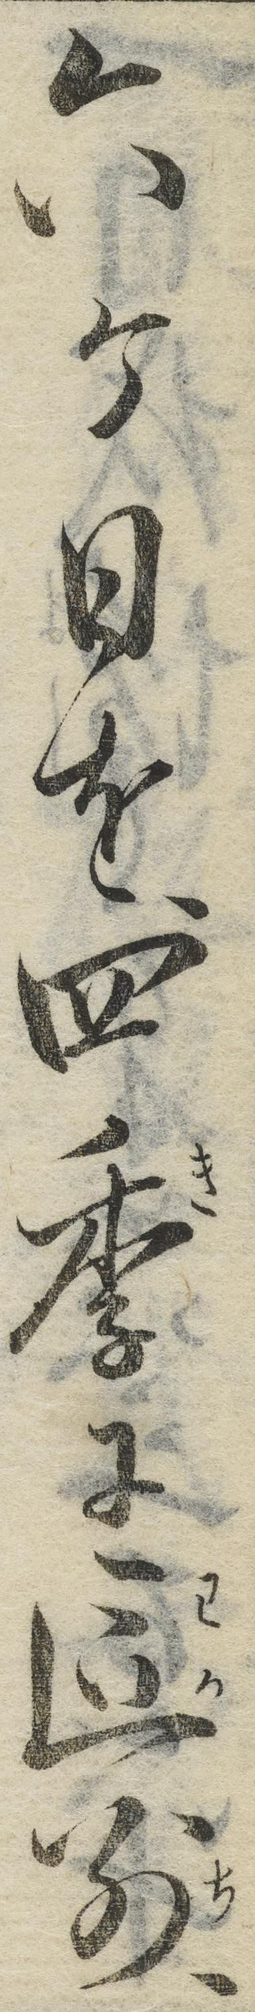六ヶ日を、四季に区分、
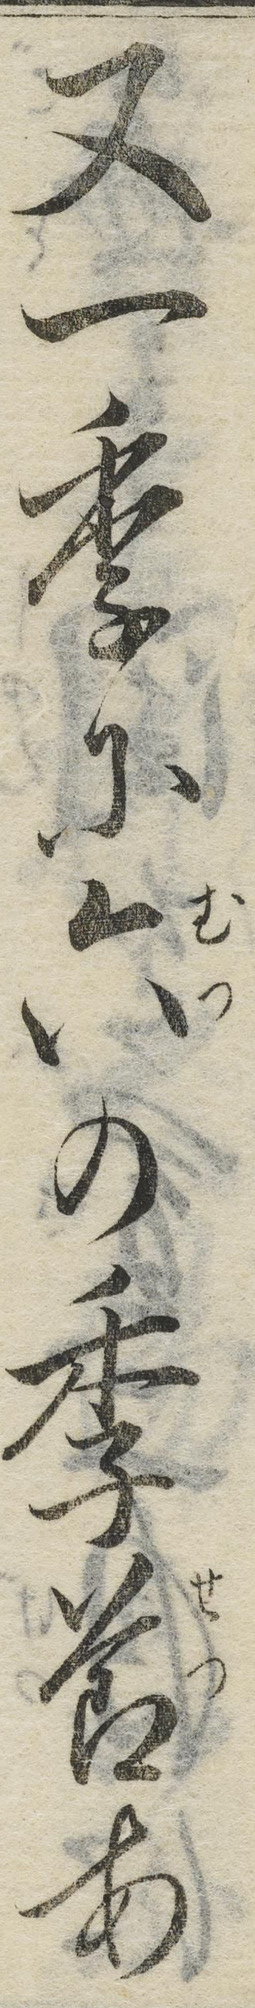又一季に六の季節あ
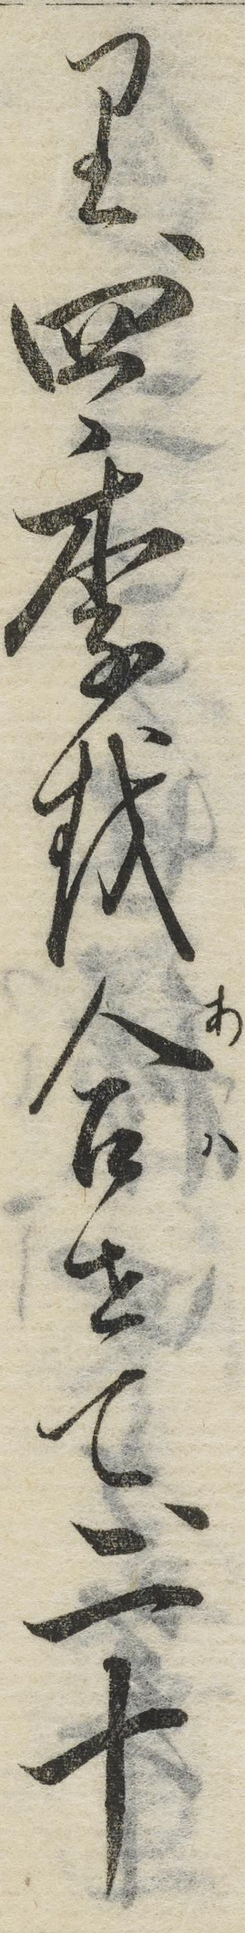り、四季を合せて、二十
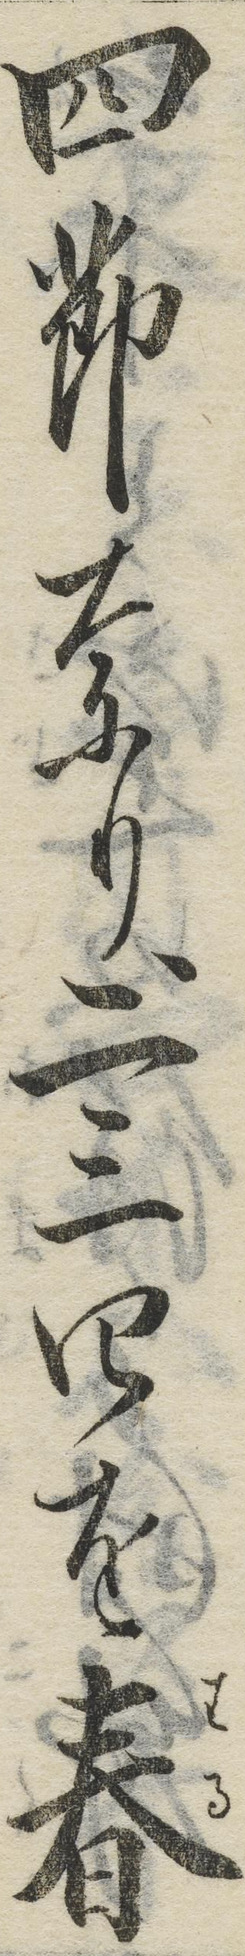四節なり、二三四を春
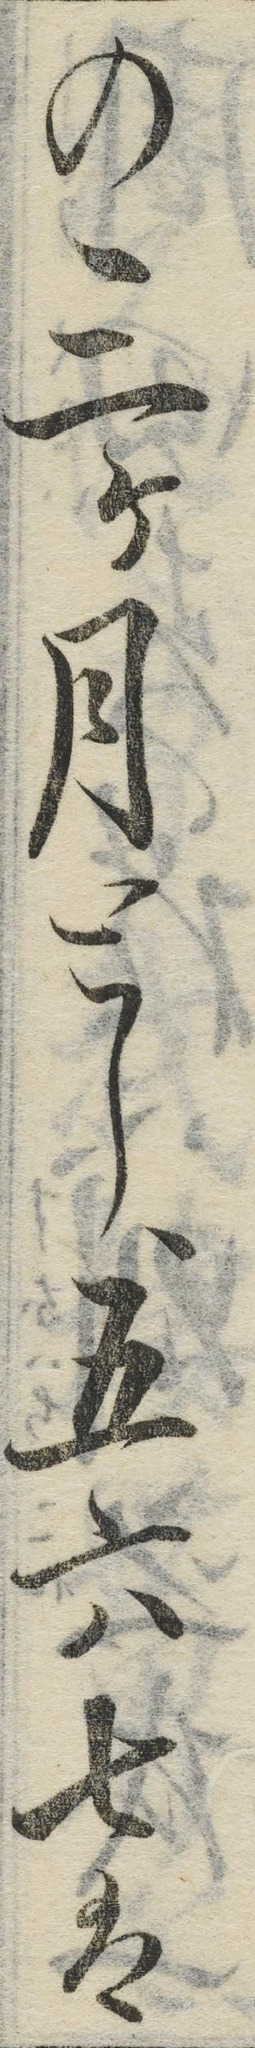の三ヶ月とし、五六七は
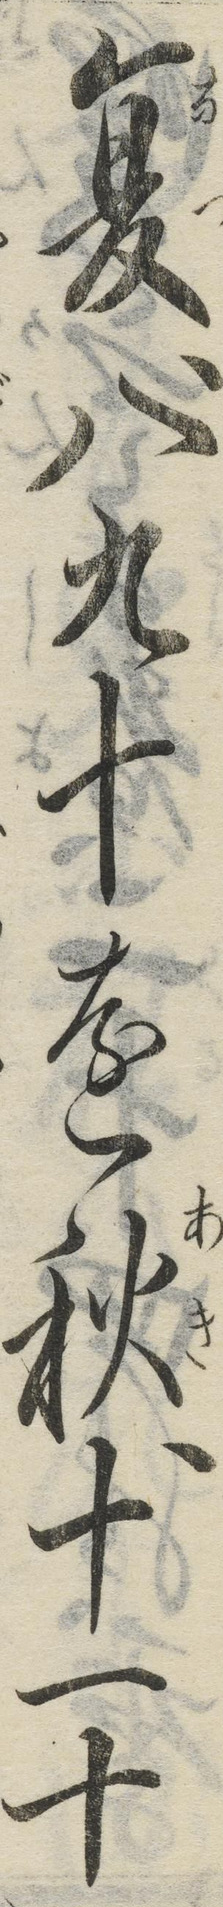夏、八九十を秋、十一十
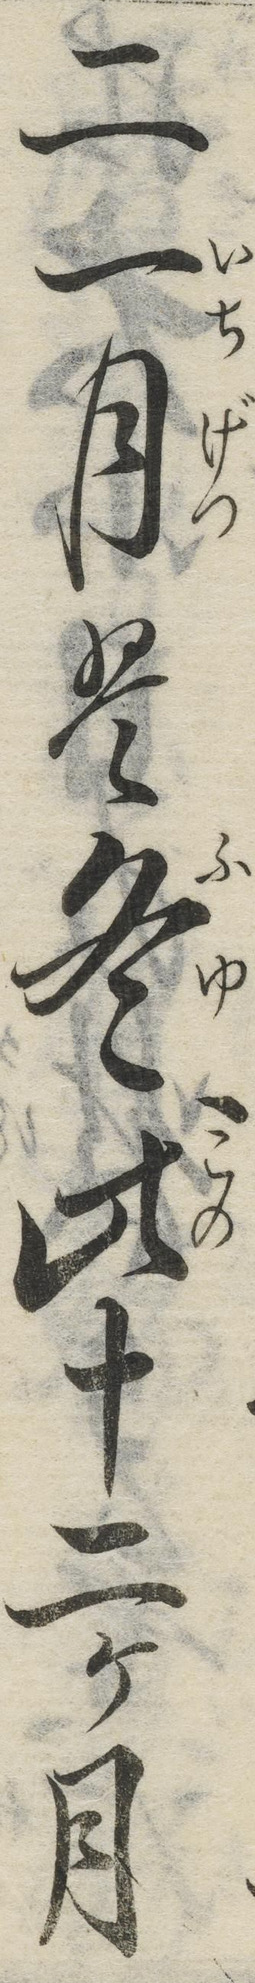二一月は冬、此十二ヶ月
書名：暦日往来　單
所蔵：東京大学地震研究所図書室 Earthquake Research Institute Library, The University of Tokyo, JAPAN
